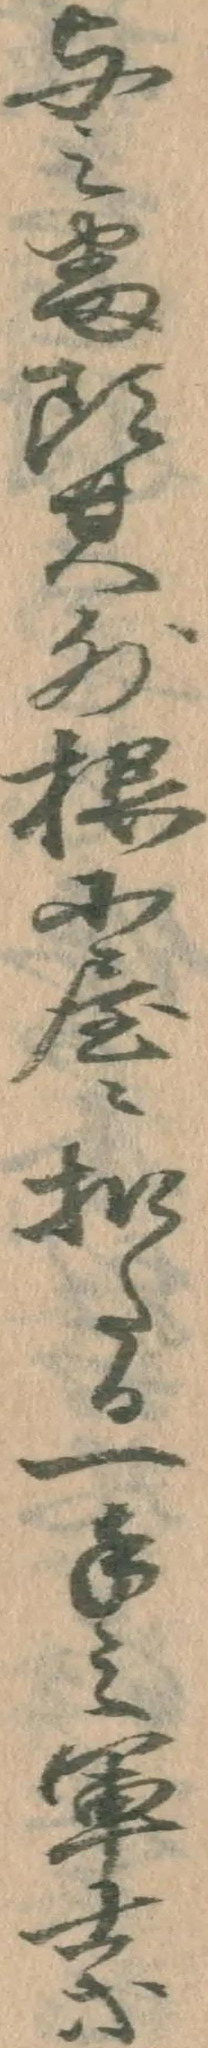与之番頭其外根小屋に扣たる一手之軍士等
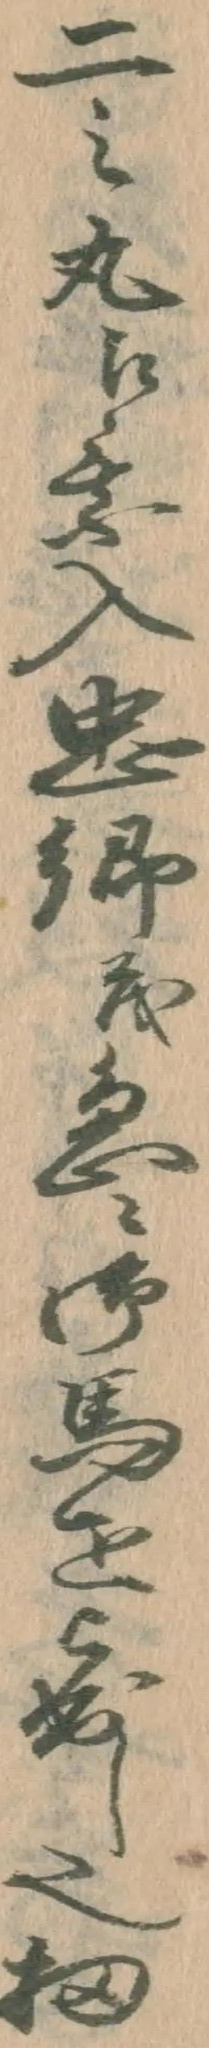二之丸江乗入忠郷茂急に御馬を被出し也扨
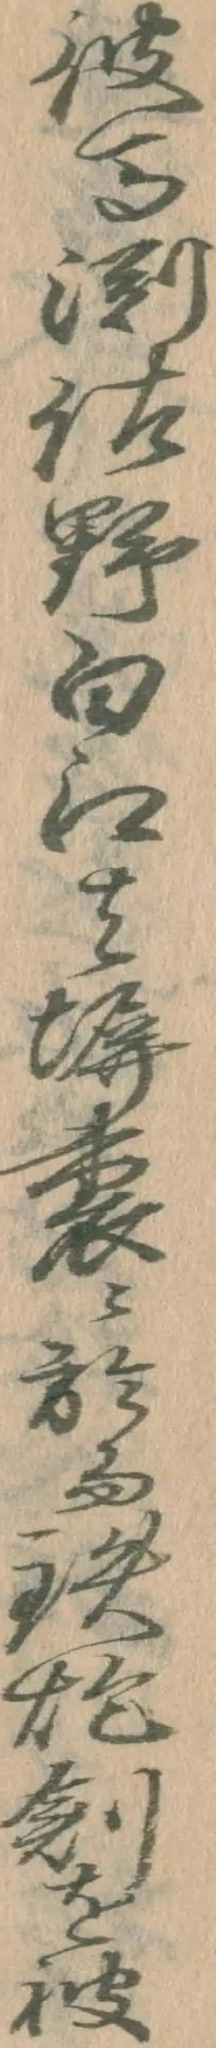彼馬渕佐野白江者塀裏に於而鉄砲創を被
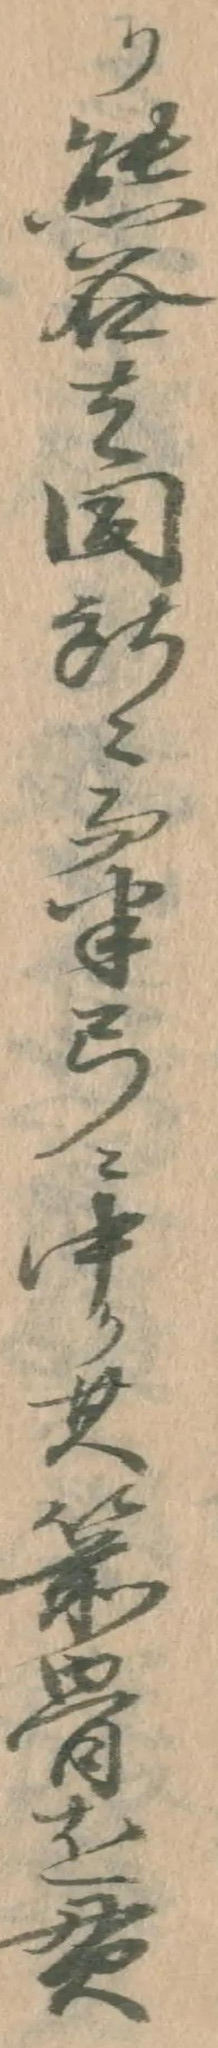り熊谷者同所に而半弓に中り其箭骨を貫
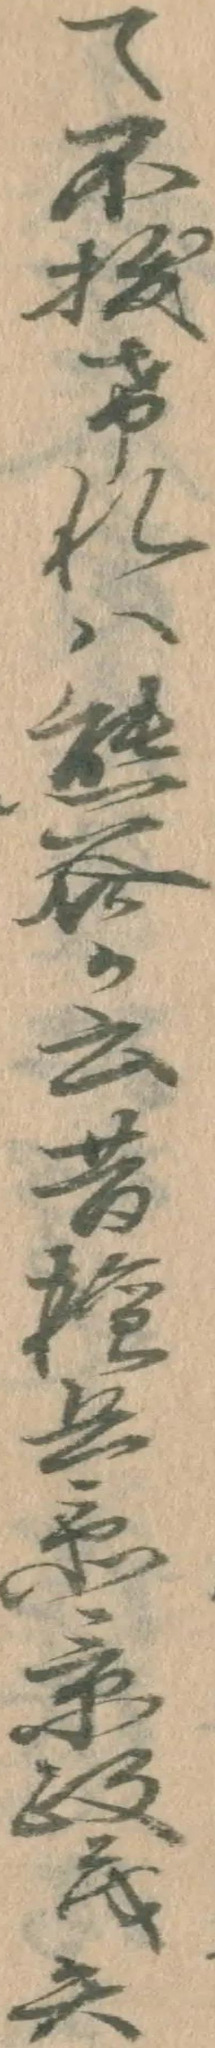て不抜希れは熊谷か云昔権兵衛京岐茂矢
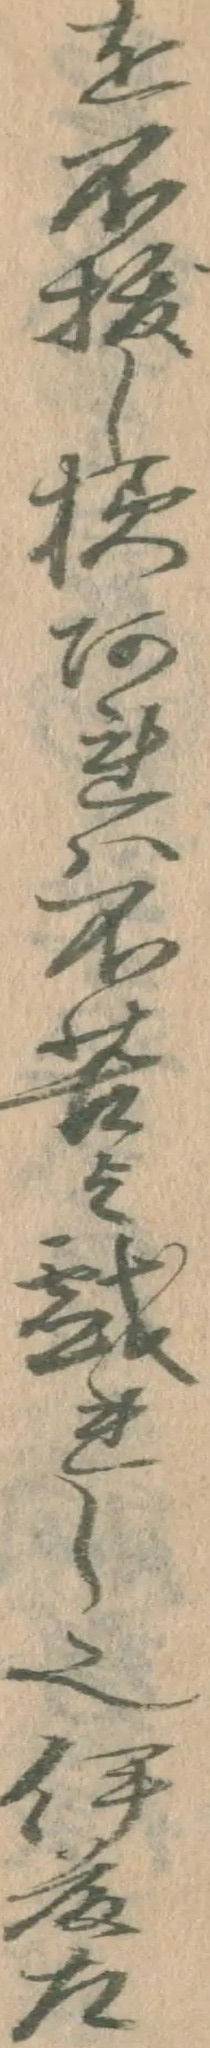を不抜し様阿連は不苦与戮連し也伊藤左
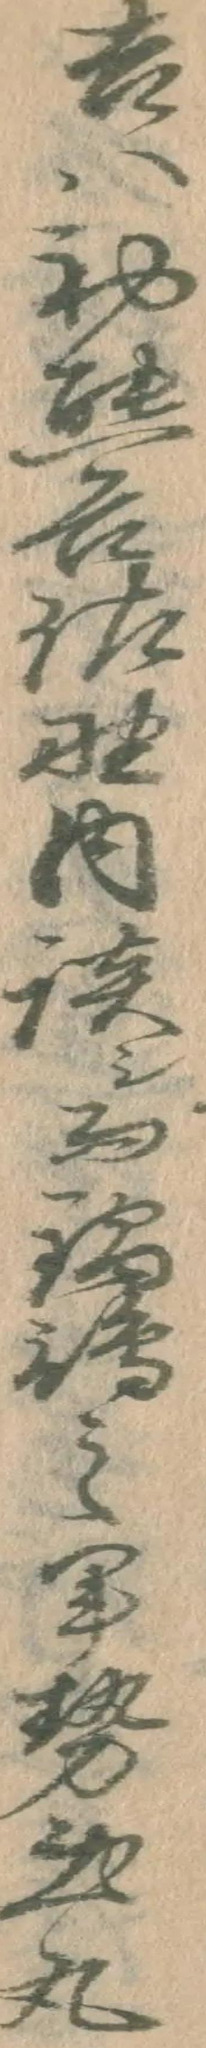吉は初熊谷佐野内談し而鍋島之軍勢出丸
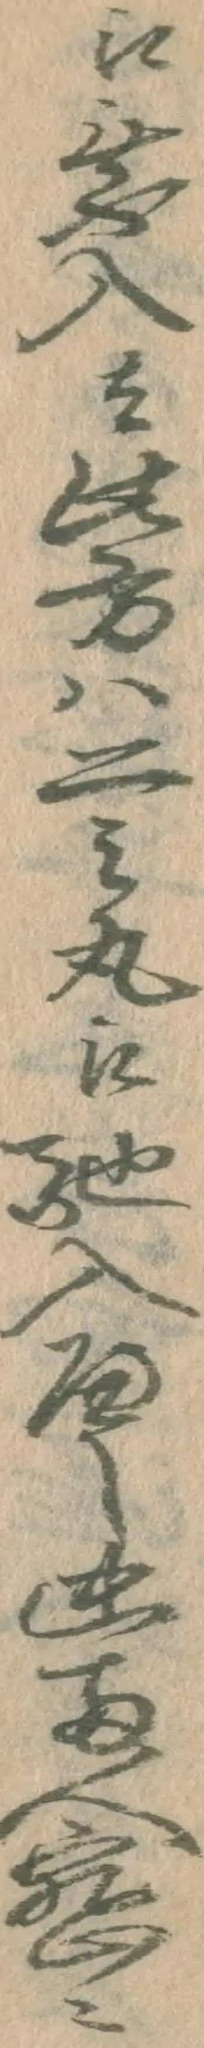江乗入者此方は二之丸江馳入扁し迚両人察に
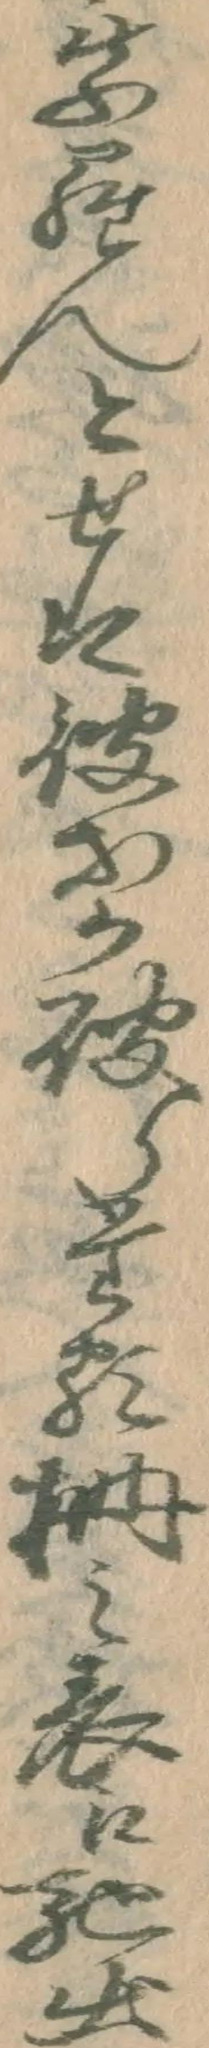乗羅んとせ春彼等か破り堂類柵之表江馳出

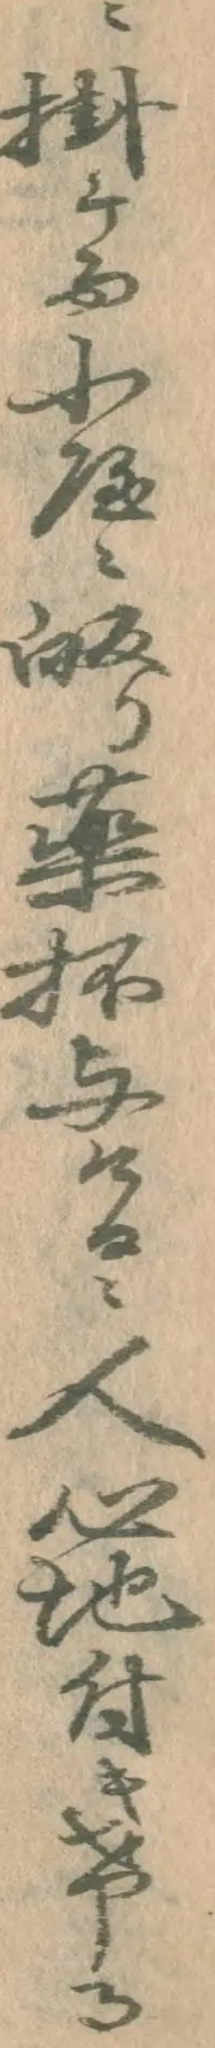に掛け而小屋に皈り薬抔与けるに人心地付き希る
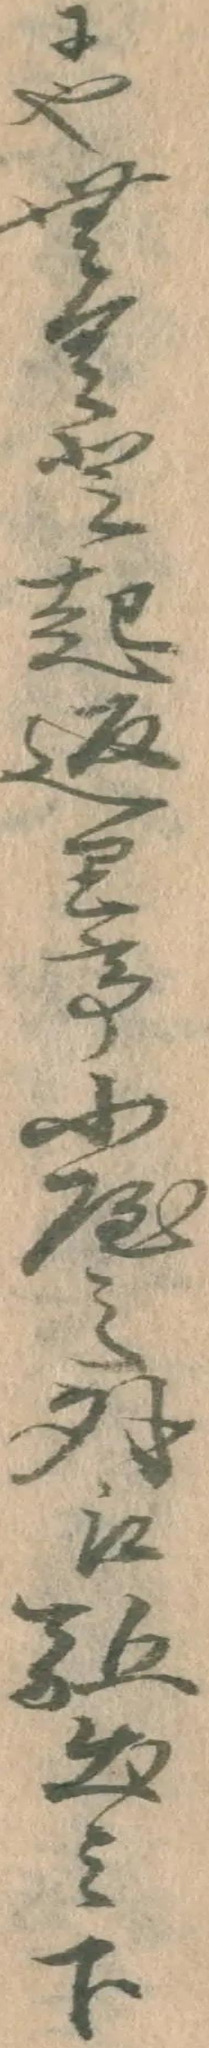尓や無具登起返里亭小屋之外江馳出与下
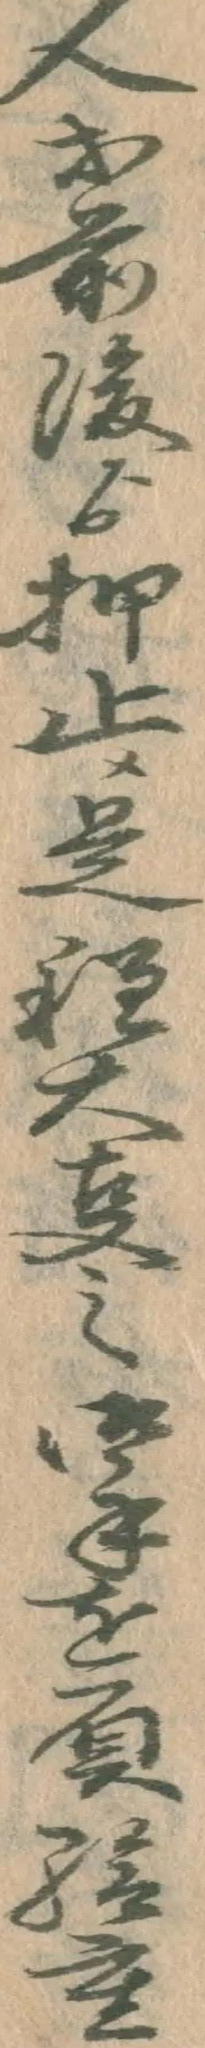人抔前後ゟ押止め是程大事之御手を負給重
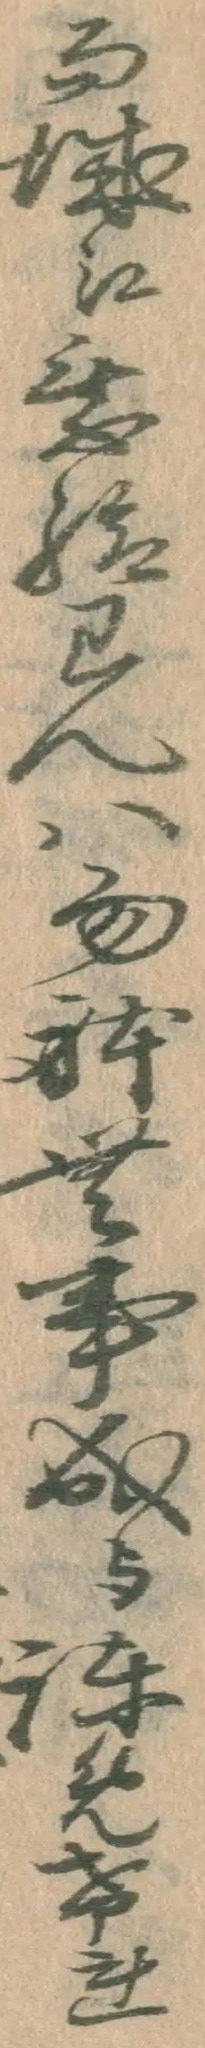而城江乗給己んは勿躰無事成与評免希連
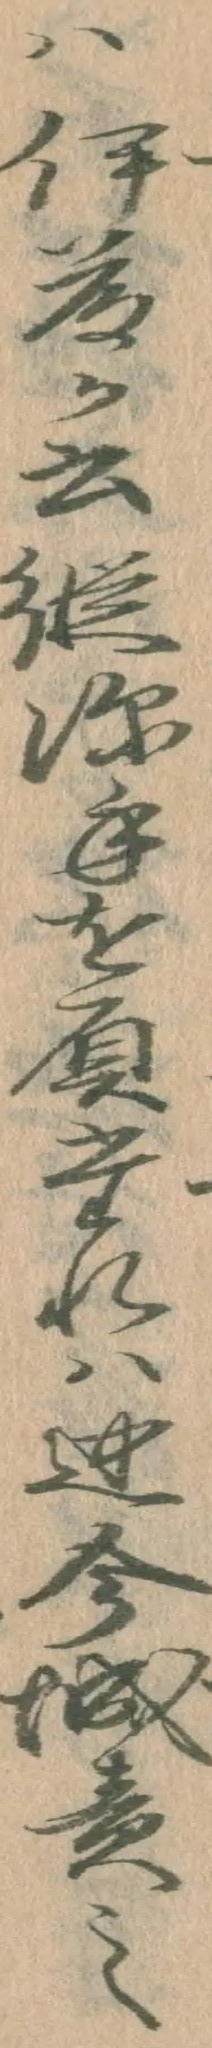は伊藤か云縦深手を負堂れは迚今城責之
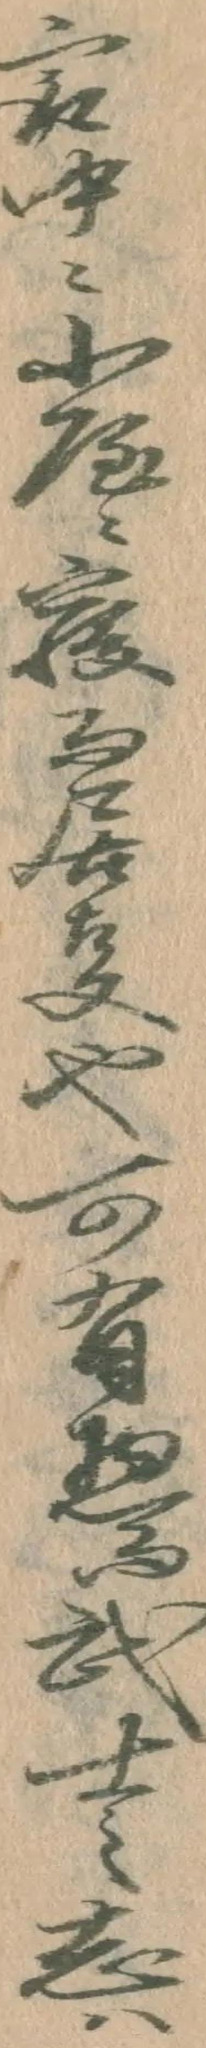最中に小屋に寝而居事也可有惣而武士之志は
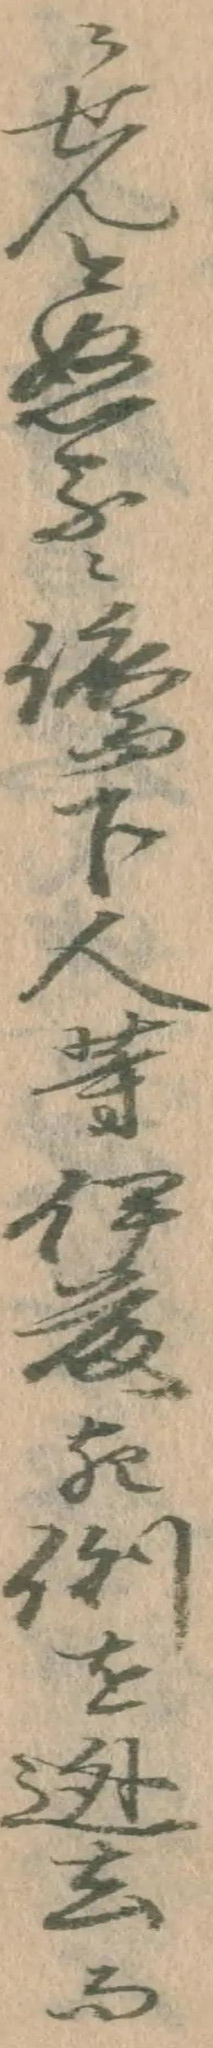にせんと怒累に依而下人等伊藤歟倒を逃去而
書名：切支丹御退治記 49巻. [8]
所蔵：国立国会図書館 National Diet Library, JAPAN
